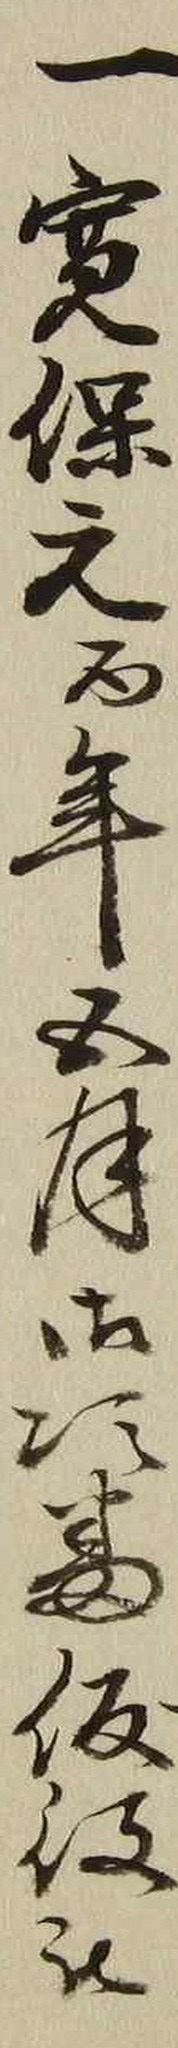一寛保元酉年五月御次番仮役被
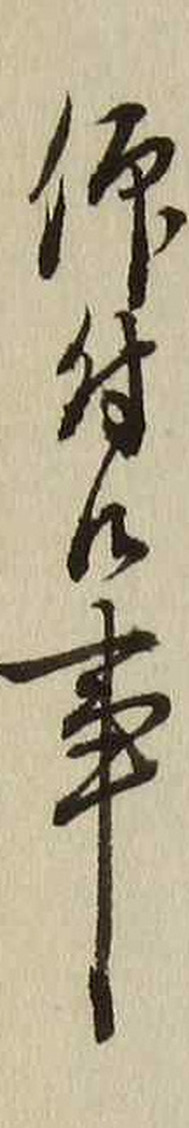仰付候事
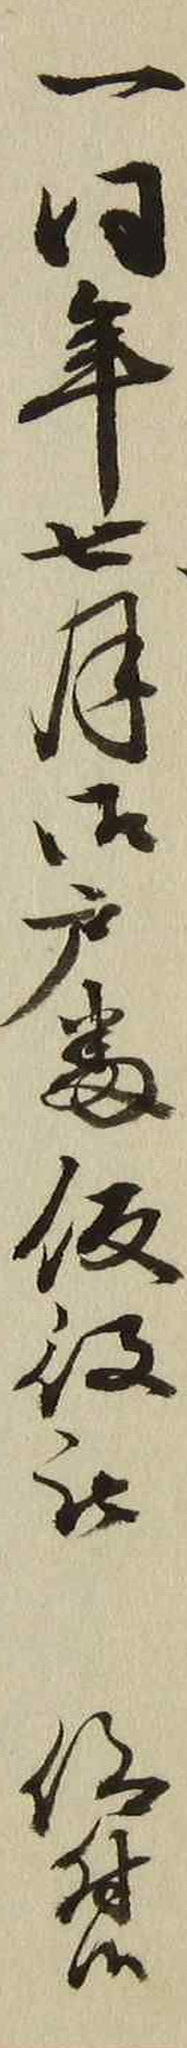一同年七月御戸番仮役被仰付候
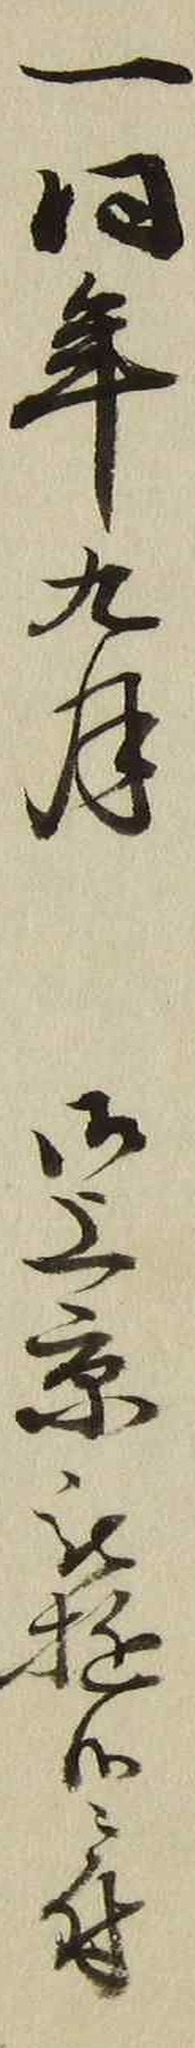一同年九月御上京被遊候ニ付
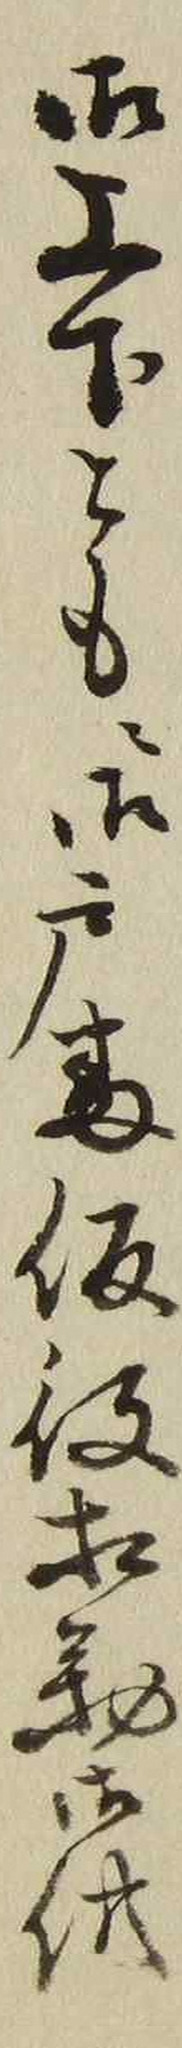御上下ともニ御戸番仮役相勤御供
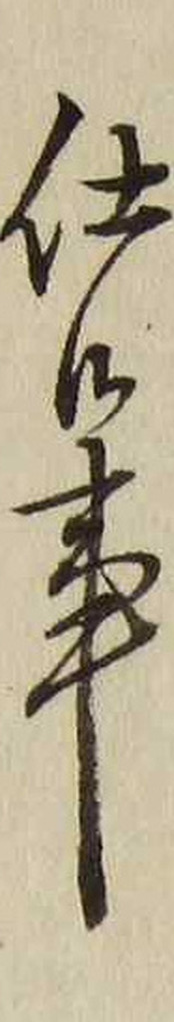仕候事
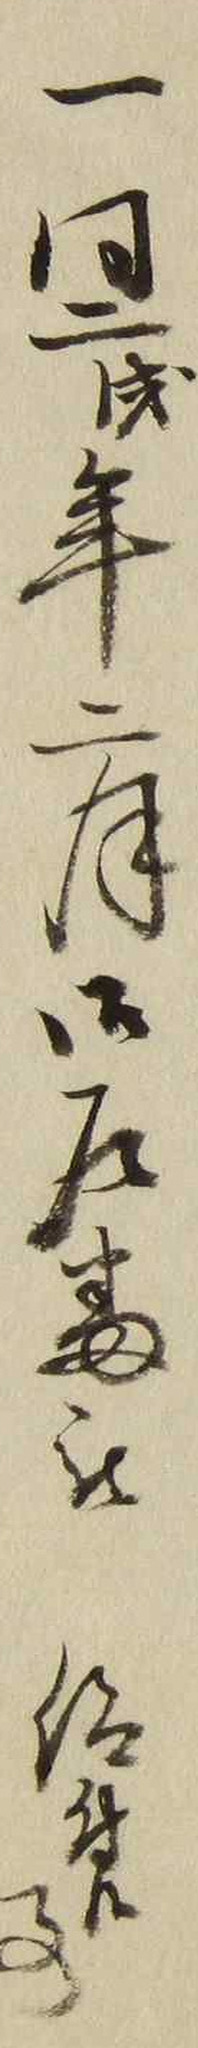一同二戌年二月御戸番被仰付候事
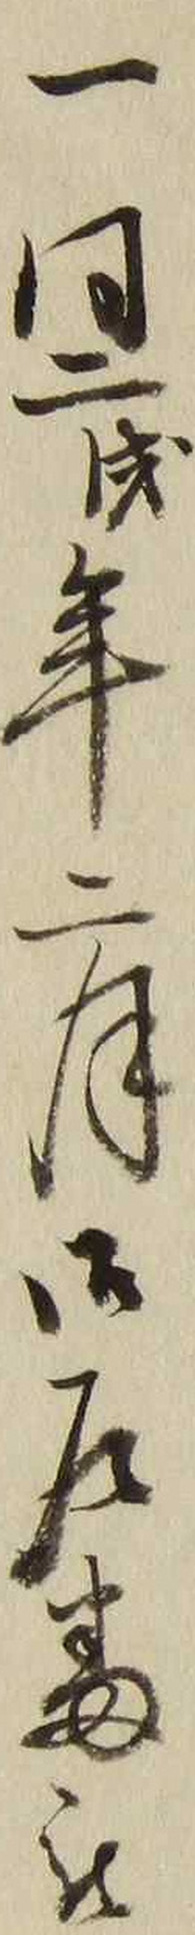一同二戌年二月御戸番被仰付候事

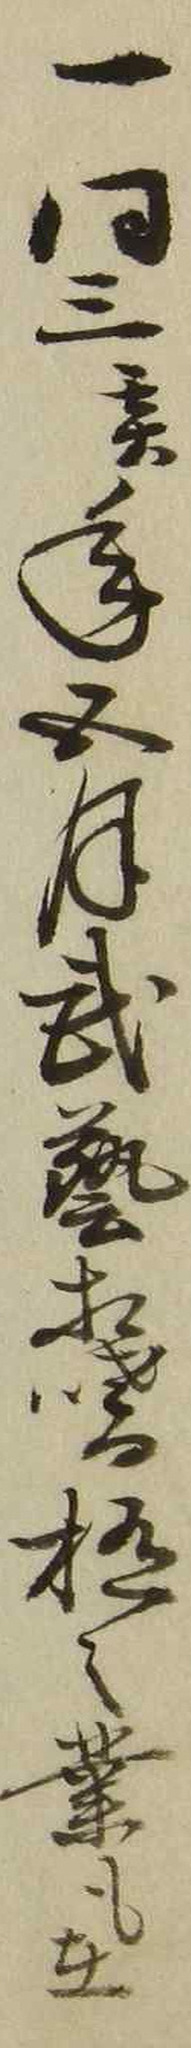一同三亥年五月武芸相嗜極之業も在
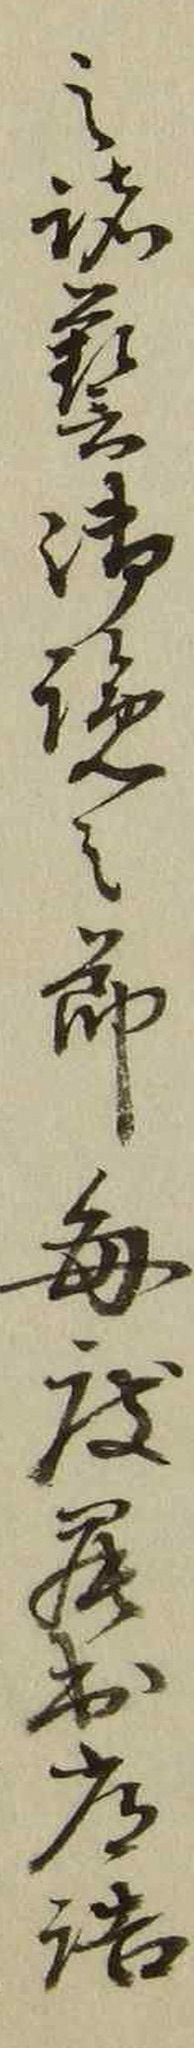之諸芸御覧之節毎度罷出常詰
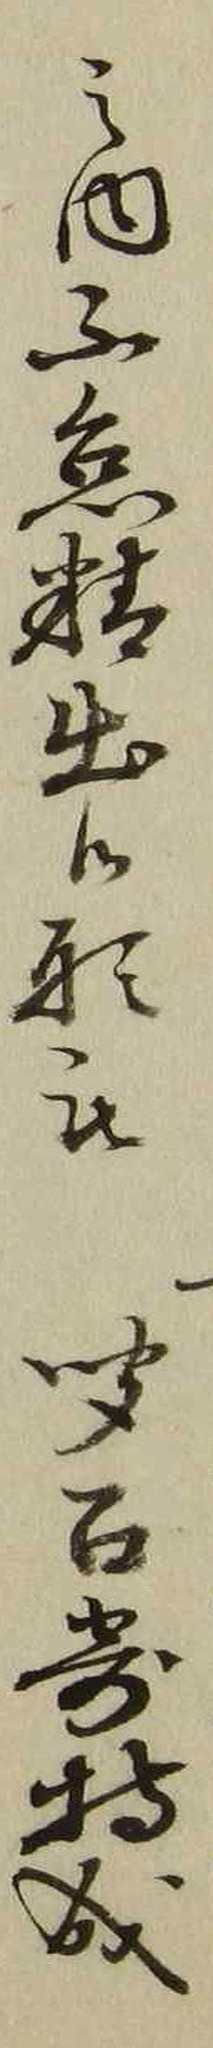之内不怠精出候形被聞召寄特成
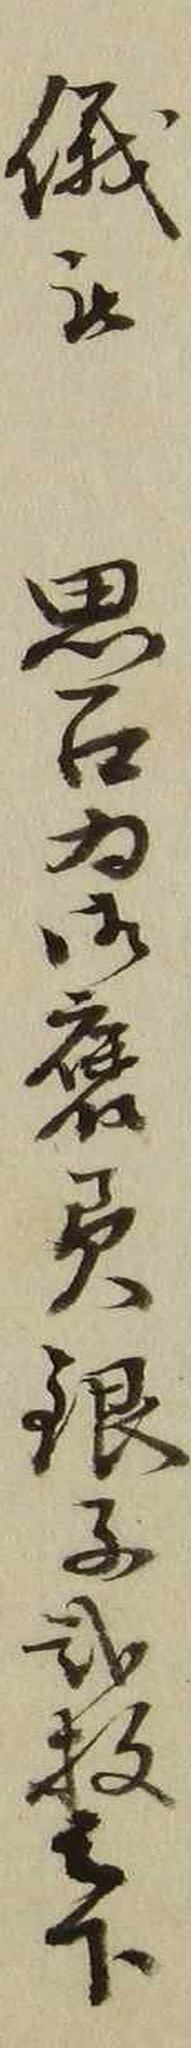儀被思召為御褒美銀子弐枚被下
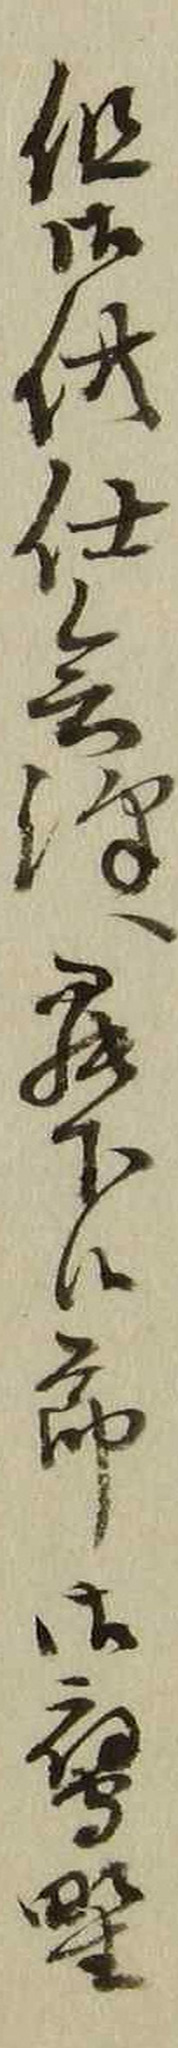但御供仕会津へ罷下候節御鷹野
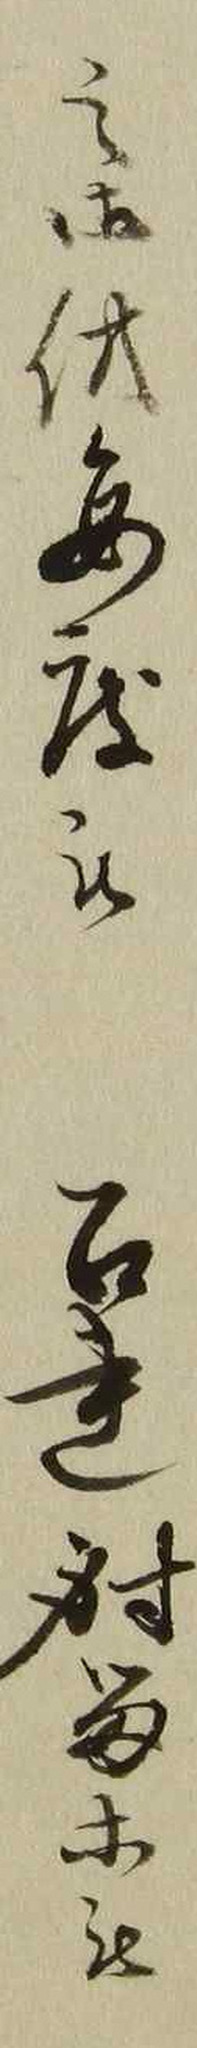之御供毎度被召連射留等被
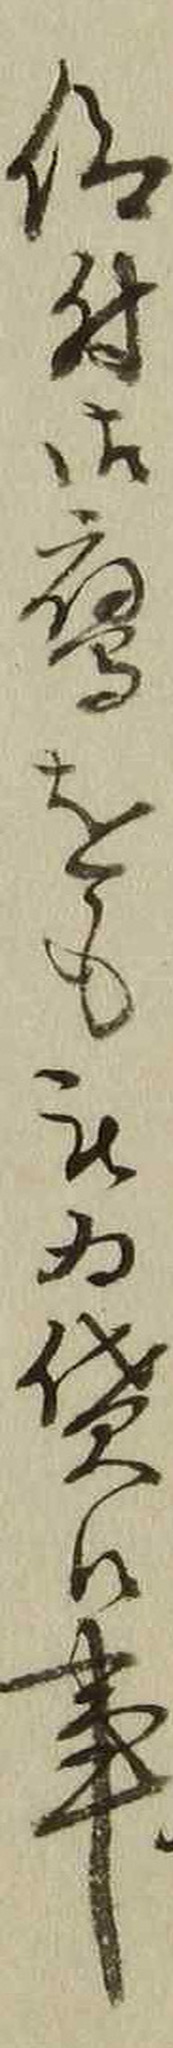仰付御鷹をも被為貸候事
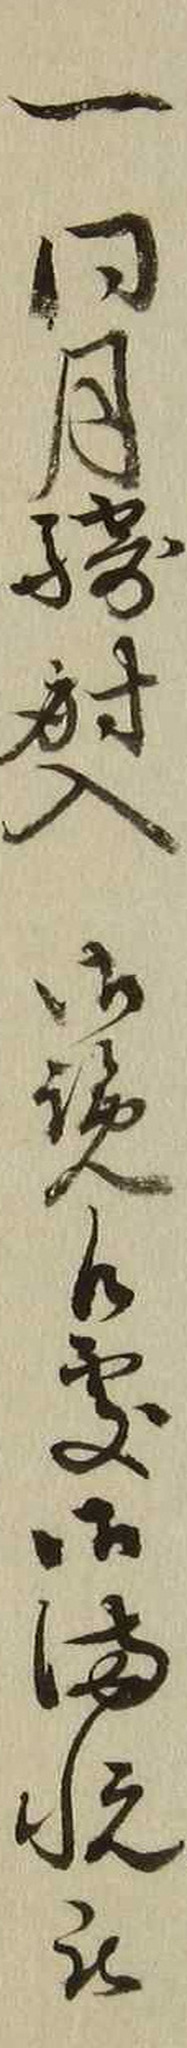一同月騎射入御覧候処御満悦被
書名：諸士系譜　巻之35　は之部3
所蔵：会津若松市立会津図書館
